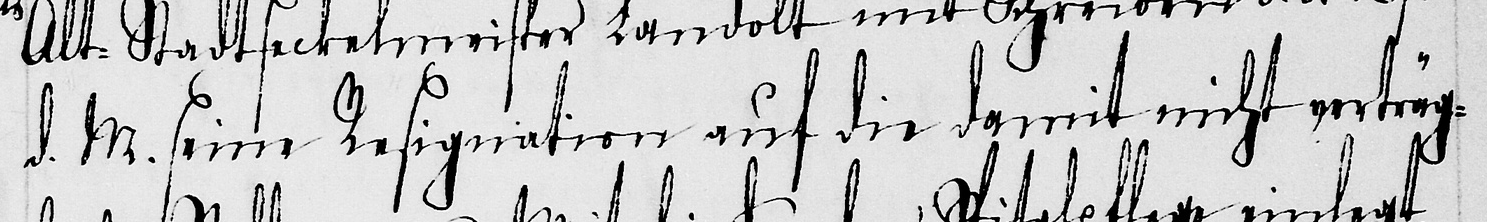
d. M. seine Resignation auf die damit nicht verträg¬
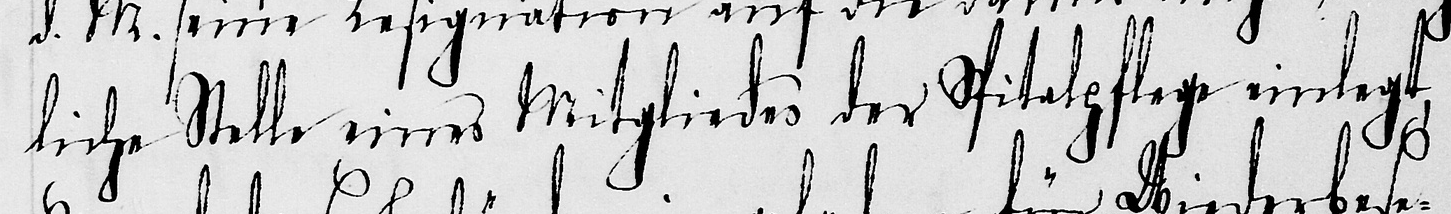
liche Stelle eines Mitgliedes der Spitalpflege einlegt,
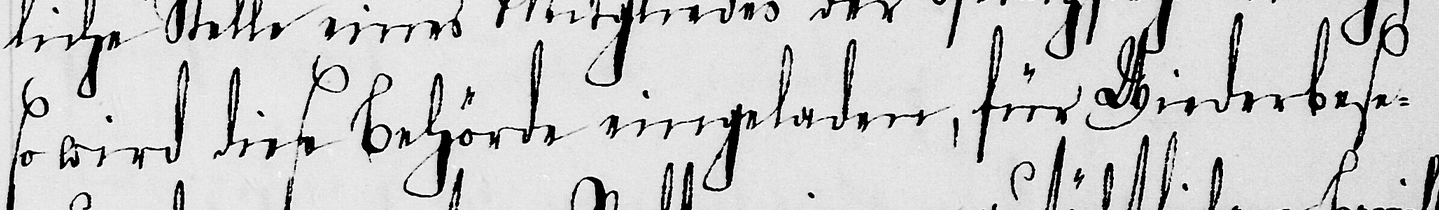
wird diese Behörde eingeladen, für Wiederbese¬
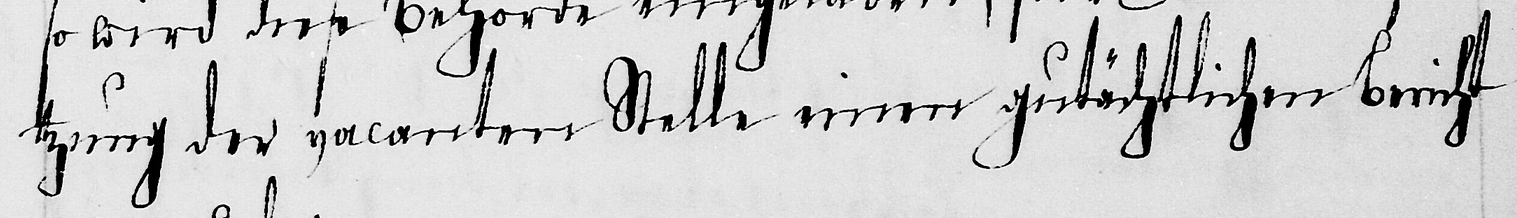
tzung der vacanten Stelle einen gutächtlichen Bericht
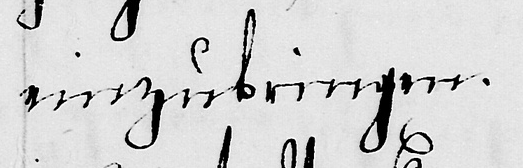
einzubringen.
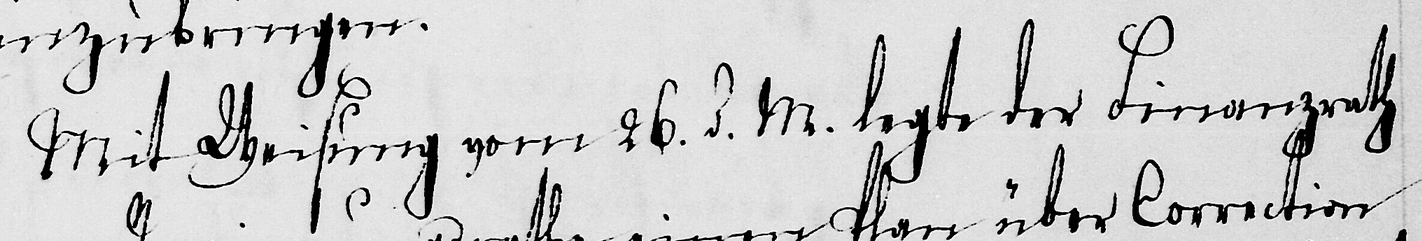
Mit Weisung vom 26. d. M. legte der Finanzrath
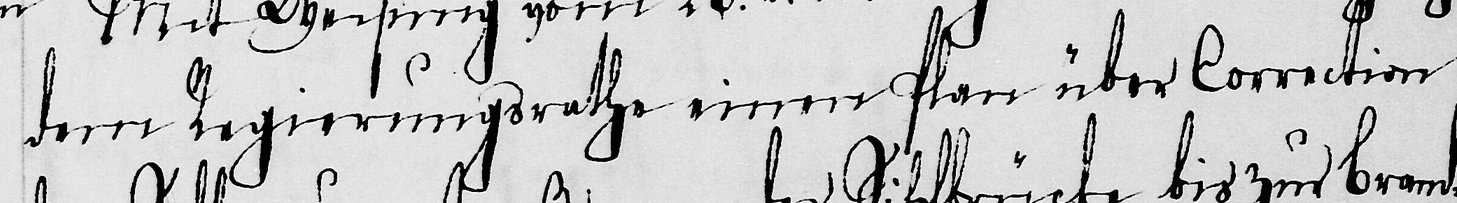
dem Regierungsrathe einen Plan über Correction
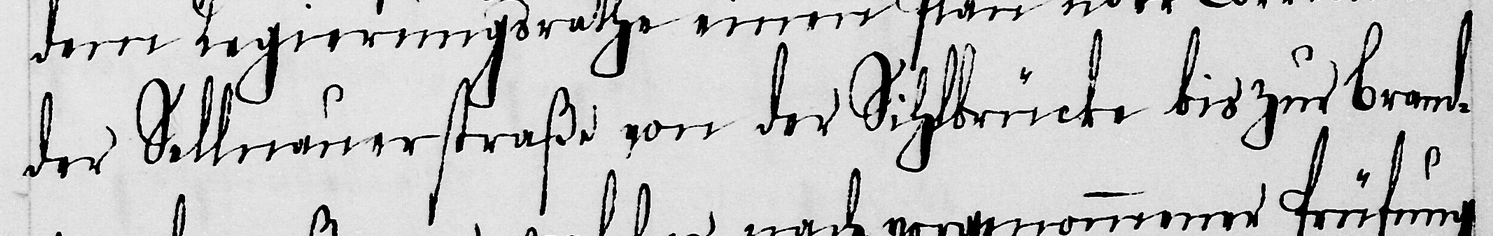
der Sellnauerstraße von der Sihlbrücke bis zur Brand¬
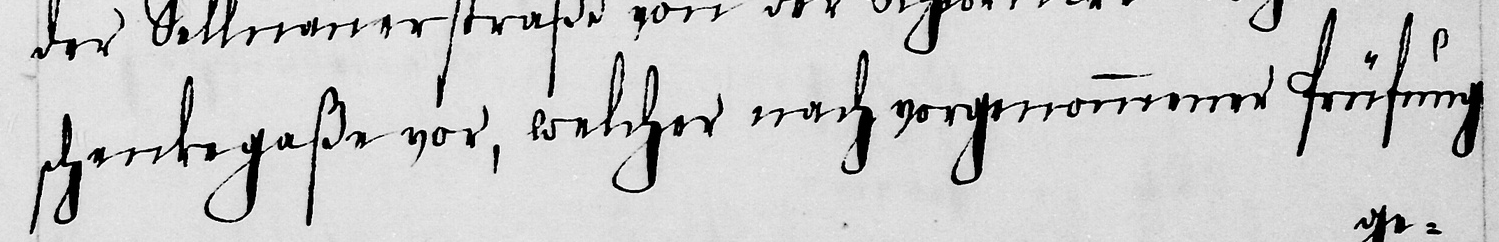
schenkegaße vor, welcher nach vorgenommener Prüfung
